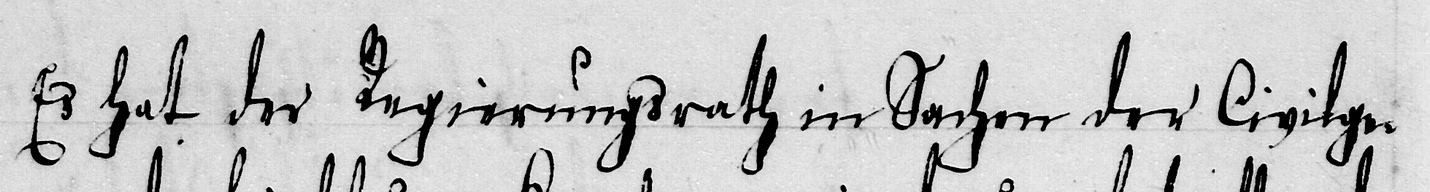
Es hat der Regierungsrath in Sachen der Civilge¬
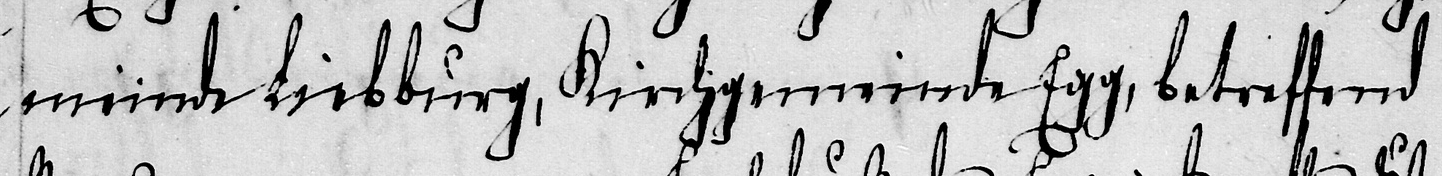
meinde Liebburg, Kirchgemeinde Egg, betreffend
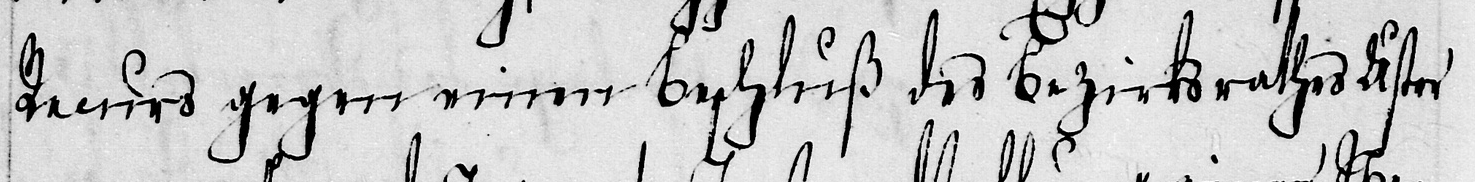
Recurs gegen einen Beschluß des Bezirksrathes Uster
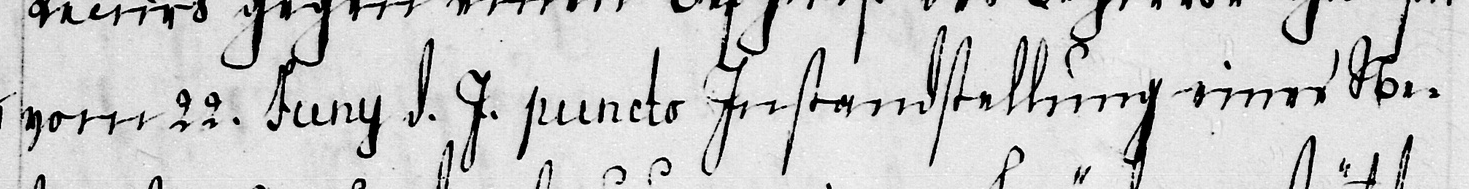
vom 22. Juny d. J. puncto Instandstellung einer Ne¬
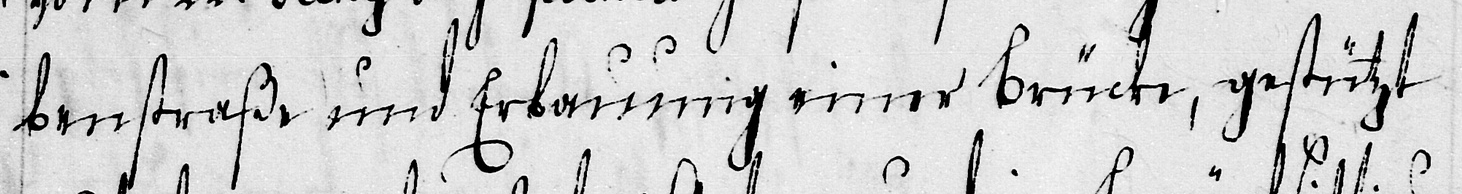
benstraße und Erbauung einer Brücke, gestützt
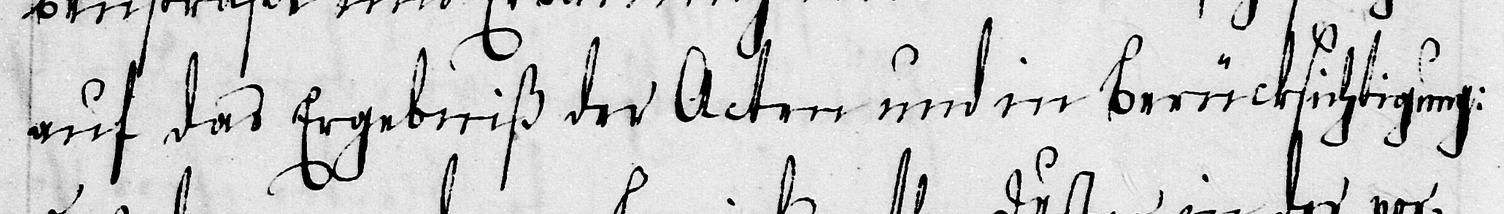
auf das Ergebniß der Acten und in Berücksichtigun¬
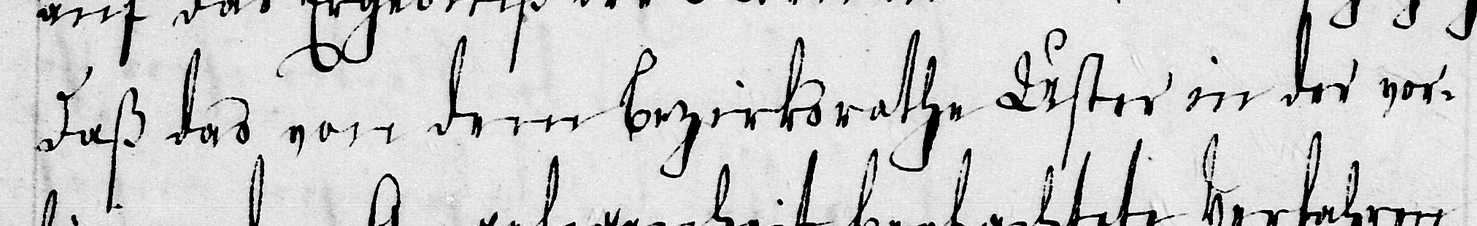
Daß das von dem Bezirksrathe Uster in der vor¬
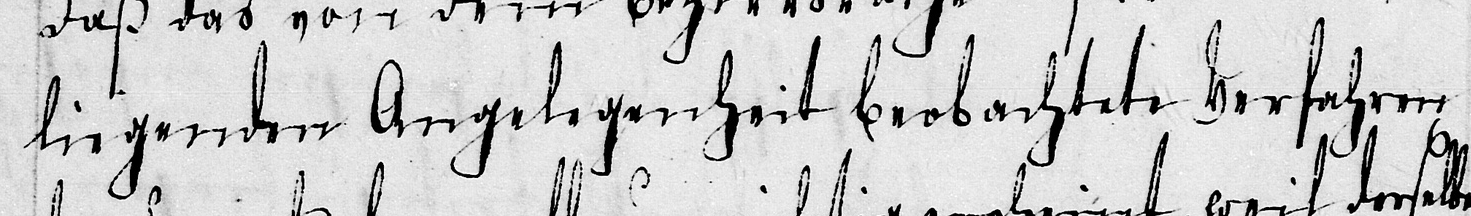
liegenden Angelegenheit beobachtete Verfahren
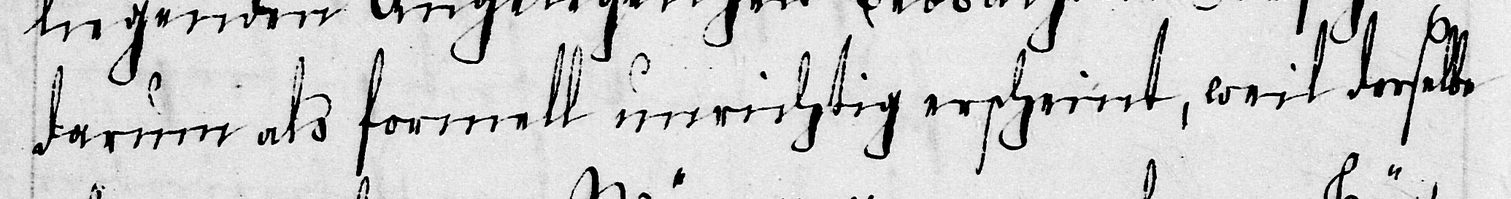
darum als formell unrichtig erscheint, weil derselbe
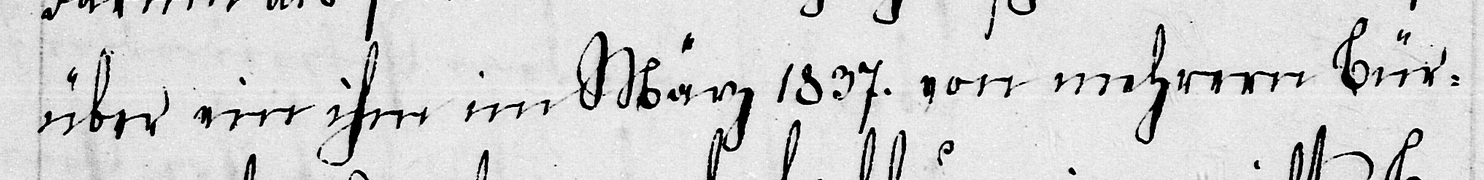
über ein ihm im März 1837. von mehrern Bür¬
